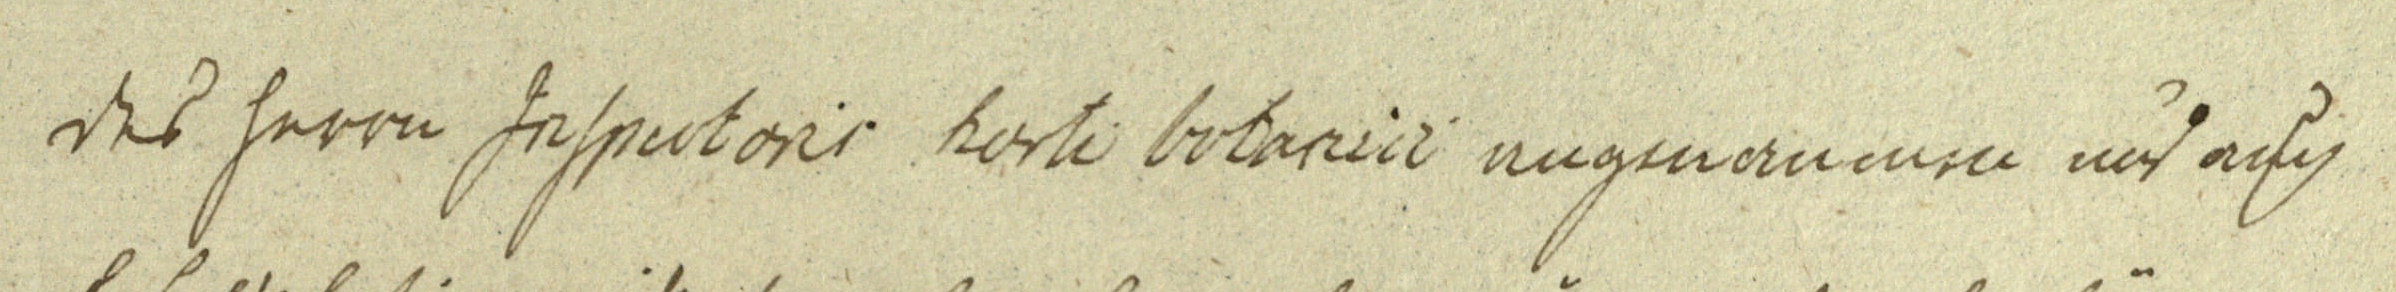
des Herrn Inspectoris horti botanici angenommen und auch
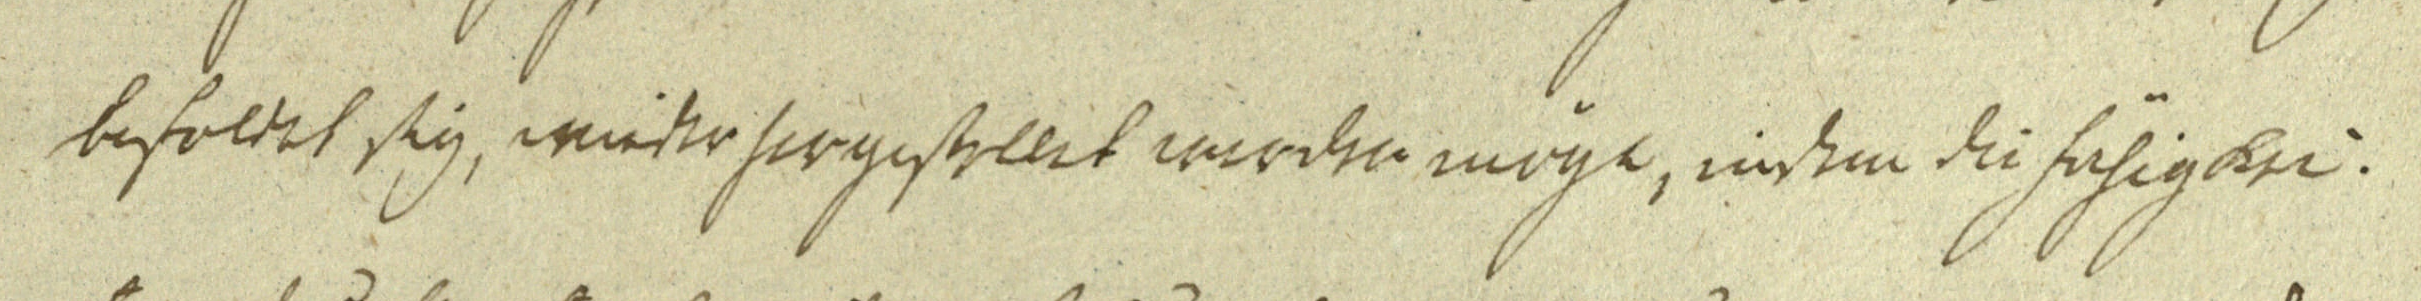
besoldet seÿ, wiederhergestellet werden möge, indem die Fähigkei¬
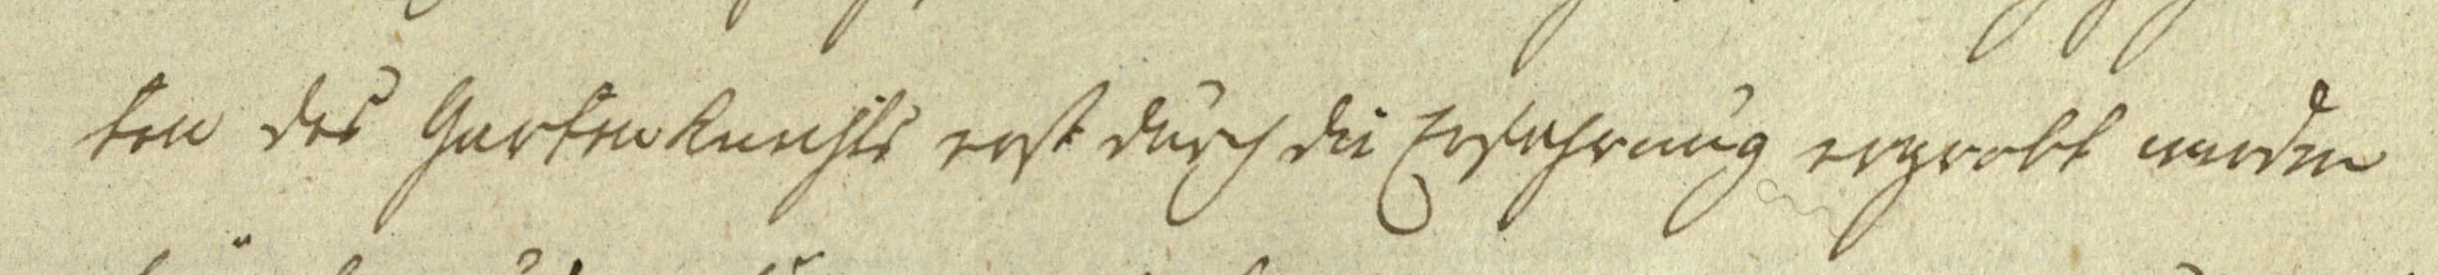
ten des Gartenknechts erst durch die Erfahrung erprobt werden
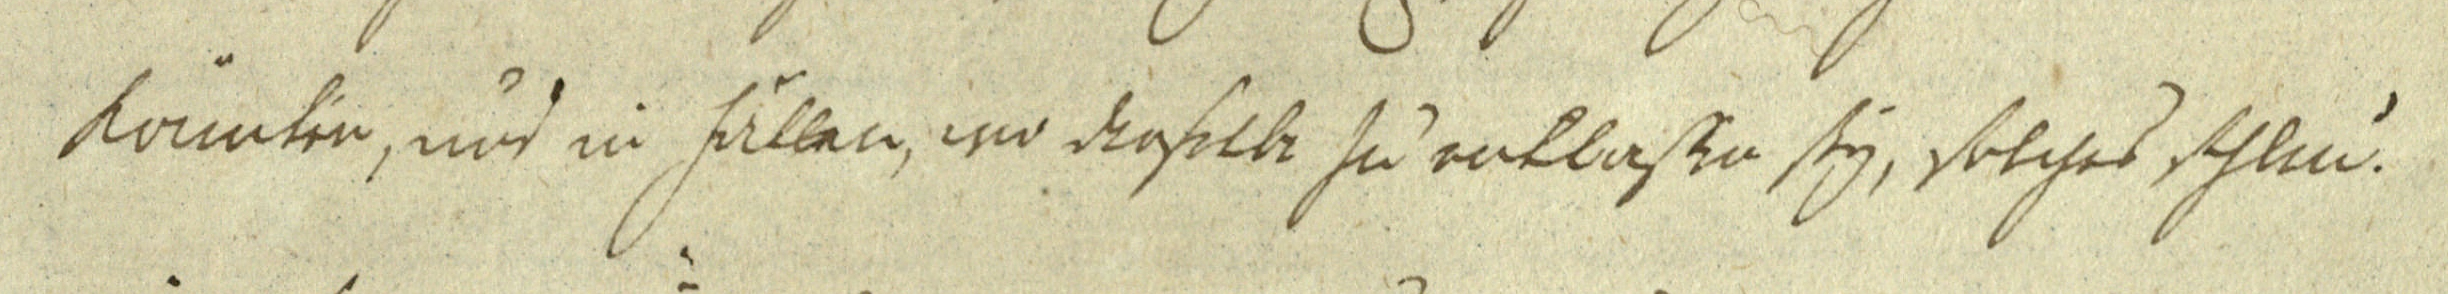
könnten, und in Fällen, wo derselbe zu entlassen seÿ, solches schleu¬
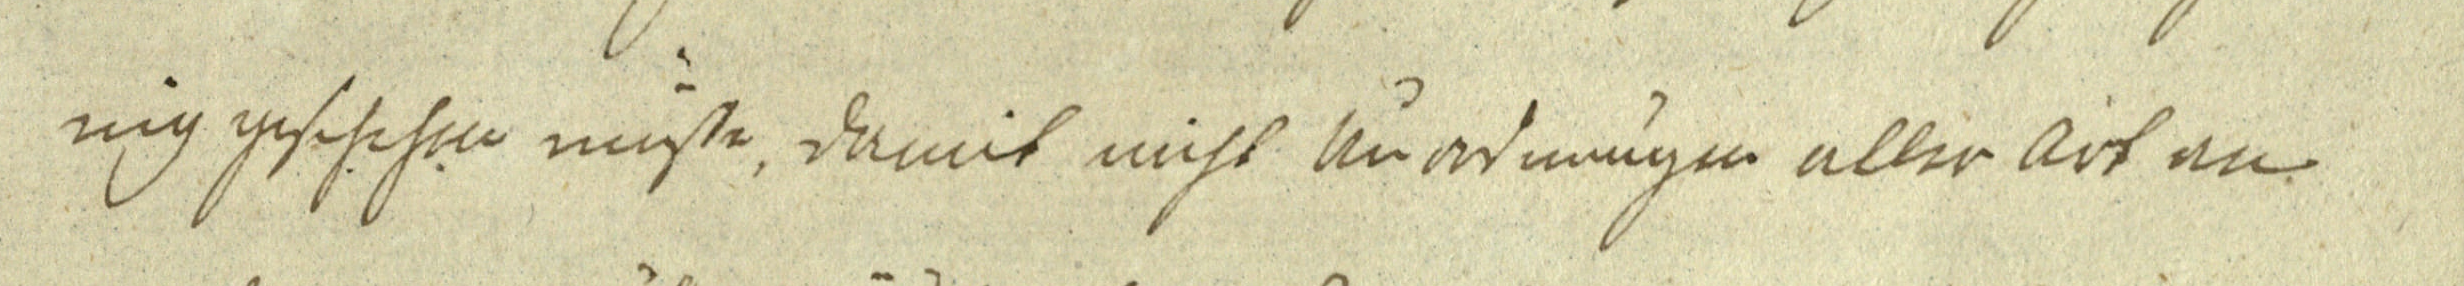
nig geschehen müsse, damit nicht Unordnungen aller Art an
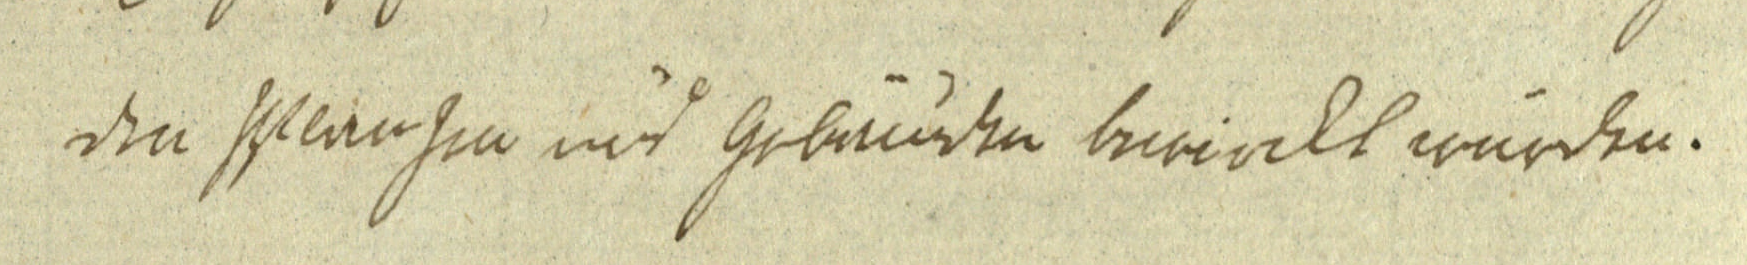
den Pflanzen und Gebäuden bewirckt würden.
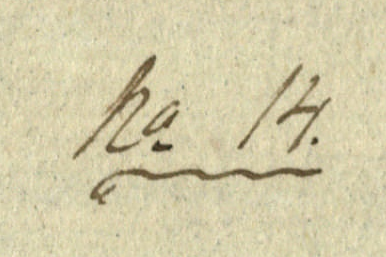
No. 14.
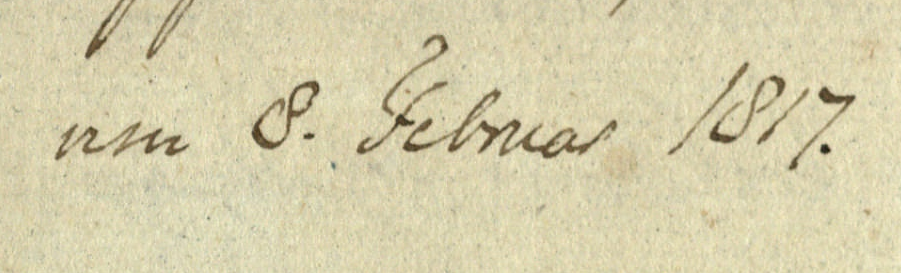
am 8. Februar 1817.
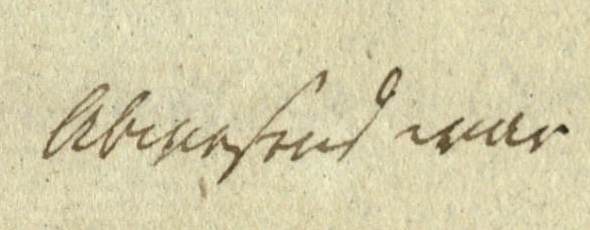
Abwesend war
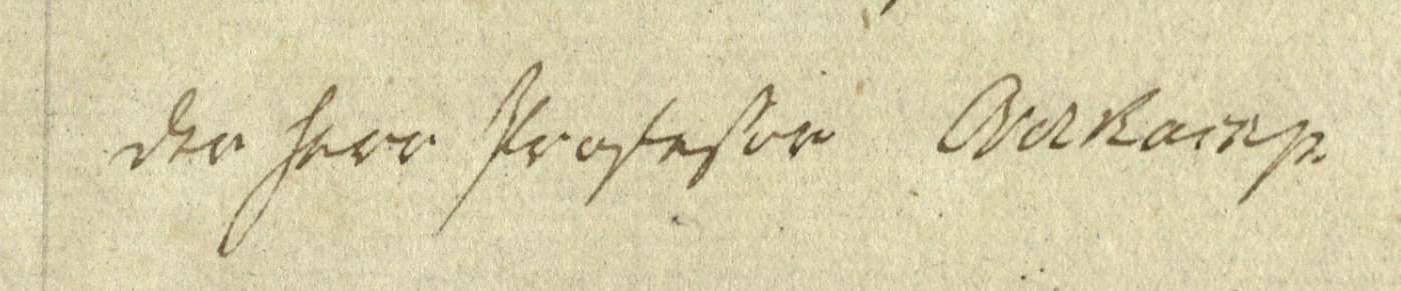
der Herr Professor Overkamp.
